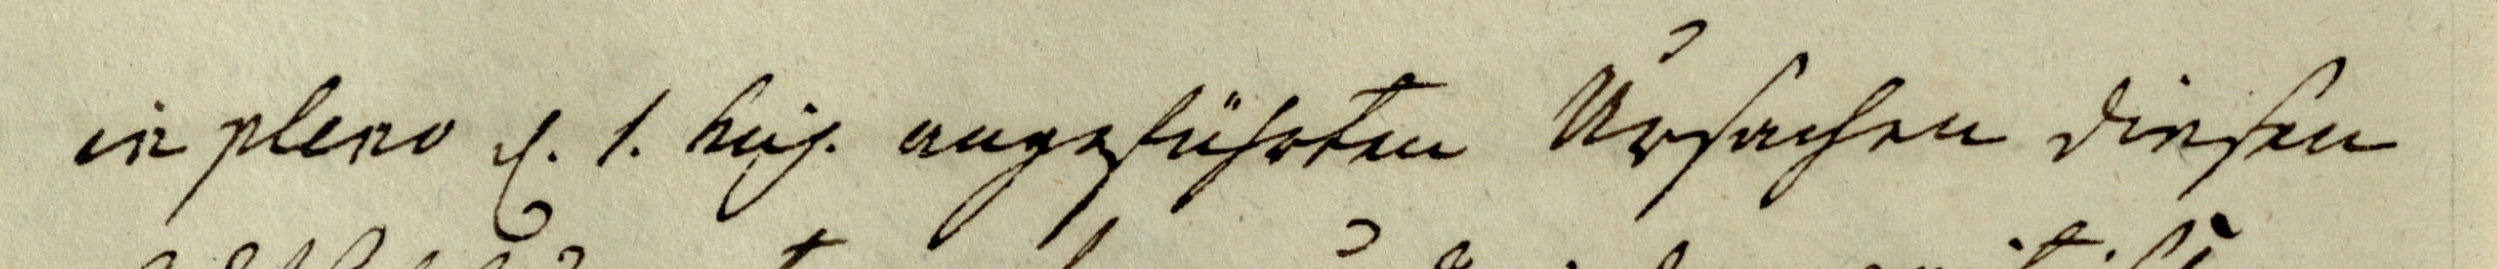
in pleno d. 1. huj. angeführten Ursachen diesen
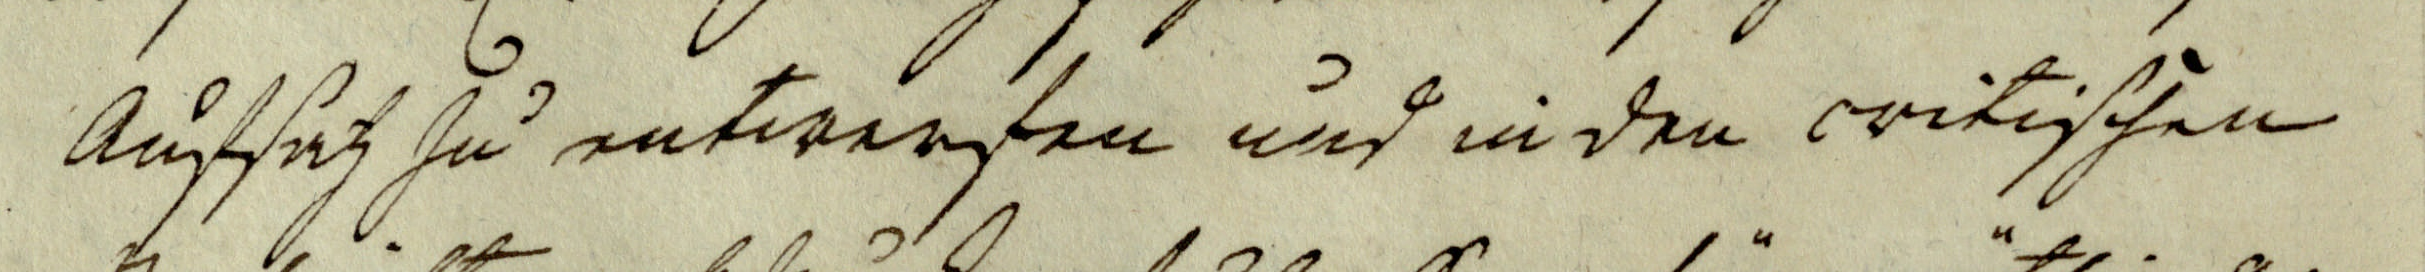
Aufsatz zu entwerfen und in den critischen
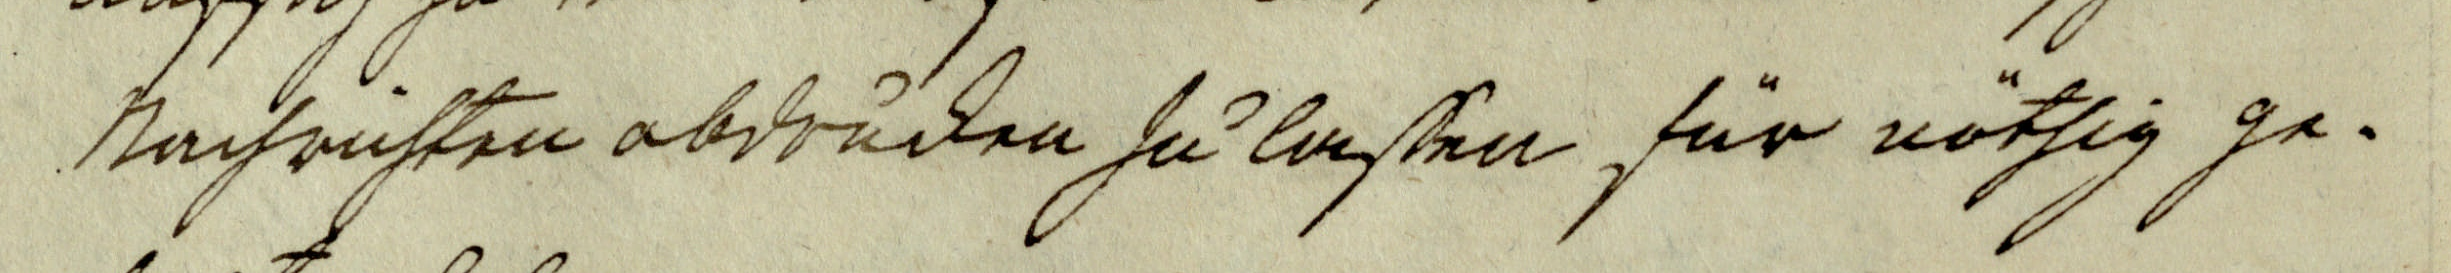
Nachrichten abdrucken zu lassen für nöthig ge¬
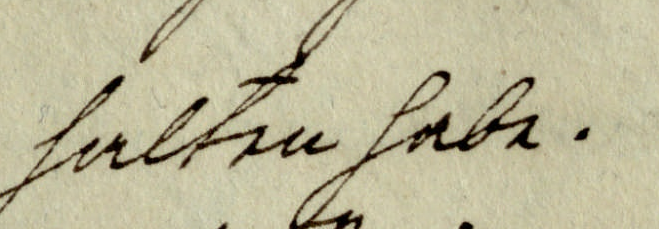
halten habe.
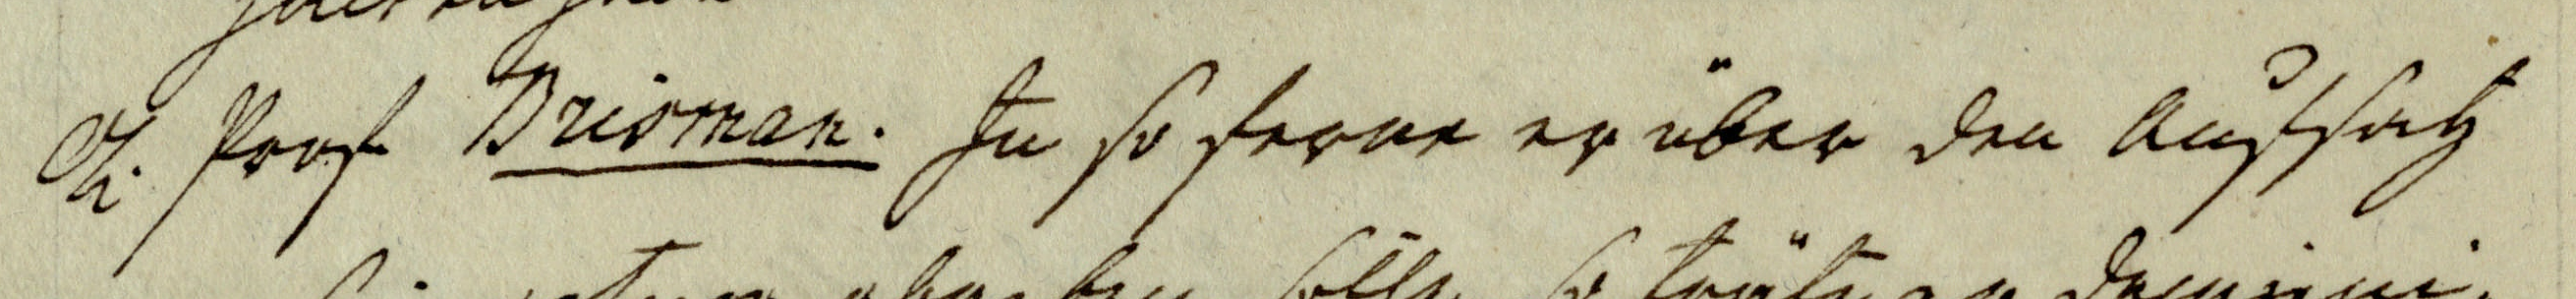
dh. Prof. Brisman. In so ferne er über den Aufsatz
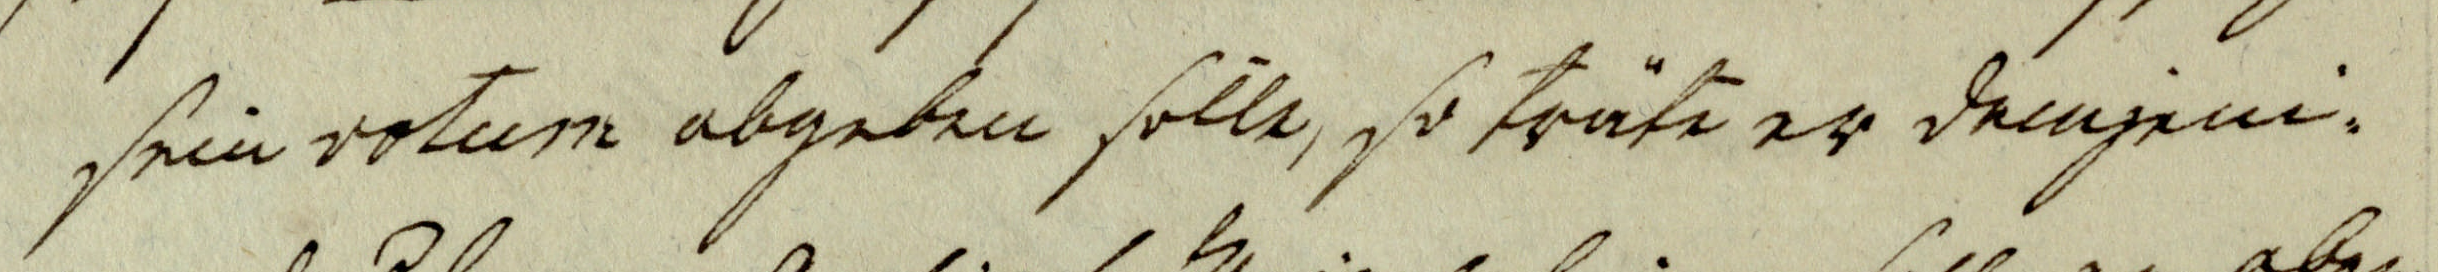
sein votum abgeben solle, so träte er demjeni¬
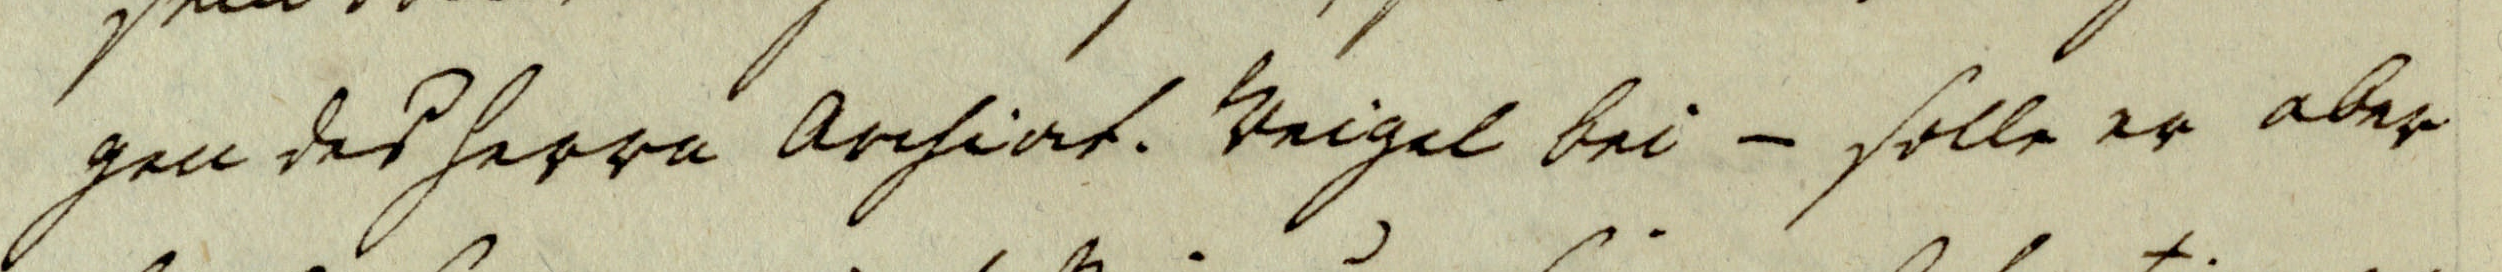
gen des Herrn Archiat. Weigel bei - solle er aber
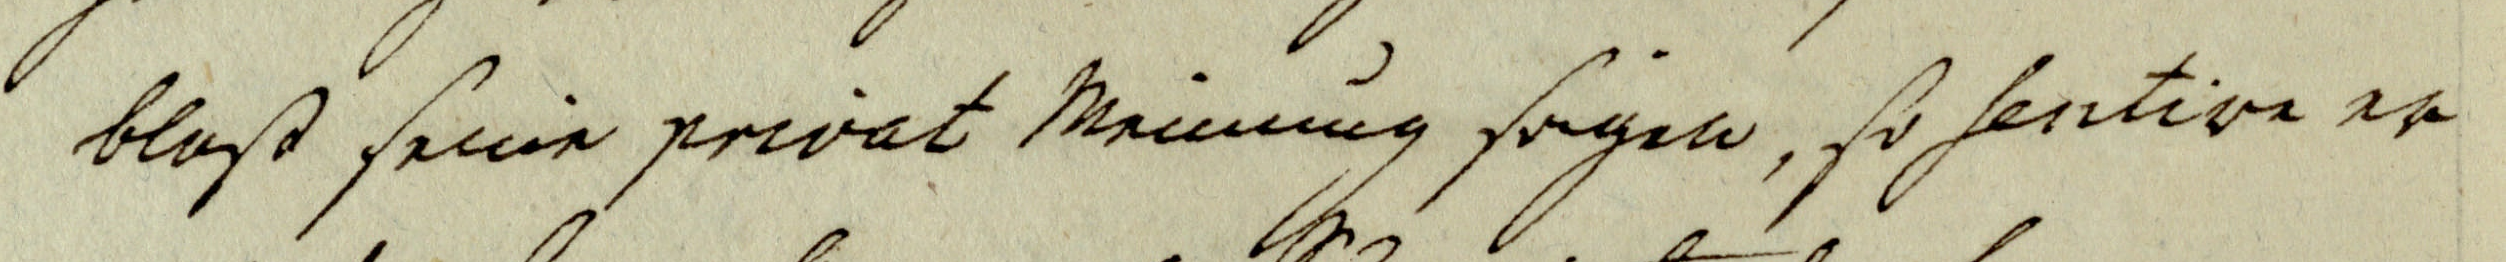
bloß seine privat Meinung sagen, so sentire er
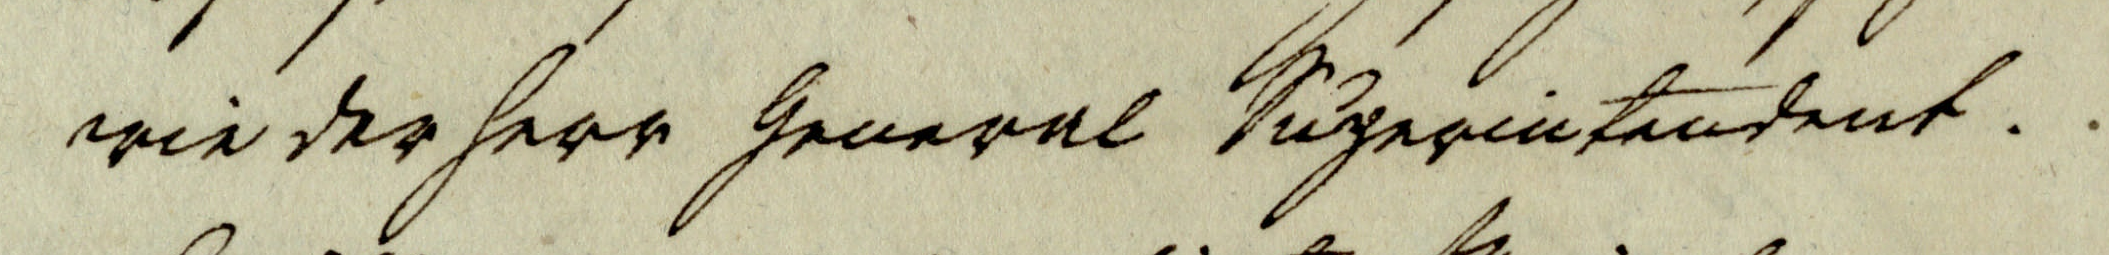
wie der Herr General Superintendent.
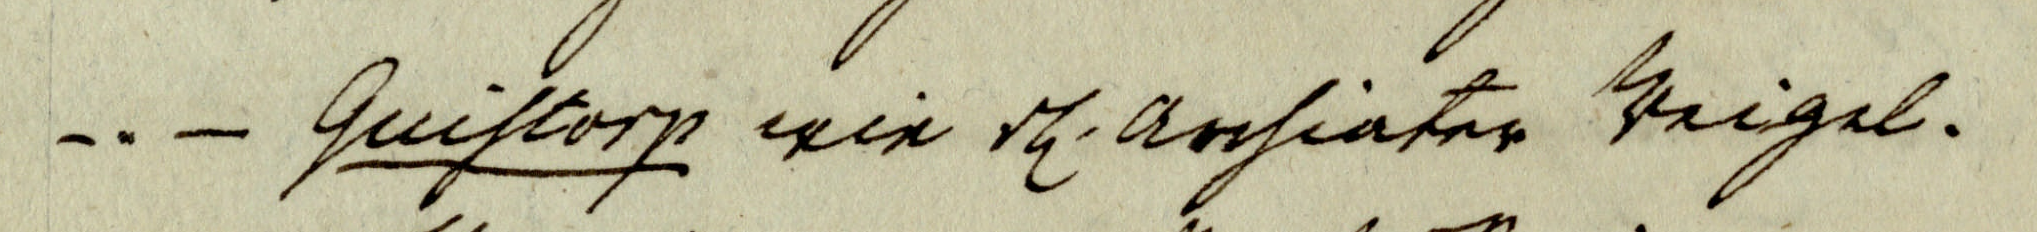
Quistorp wie dh. Archiater Weigel.
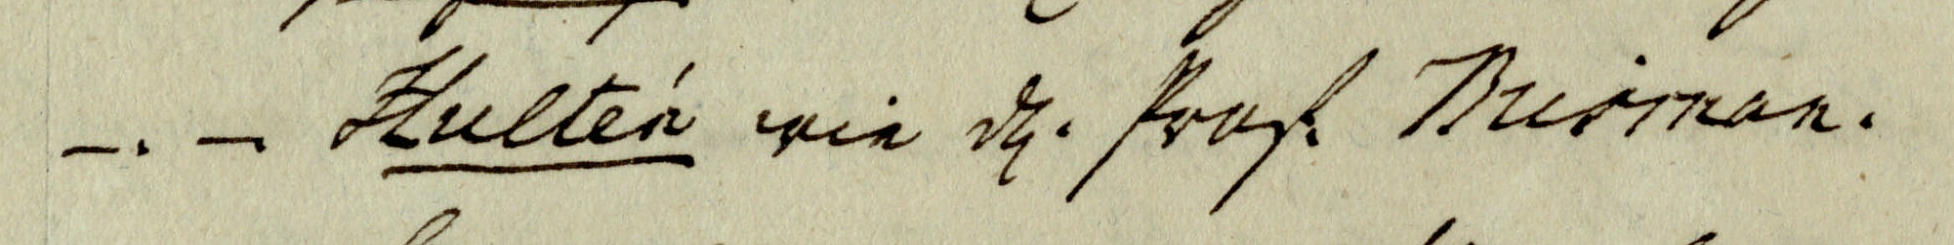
Hultén wie dh. Prof. Brisman.
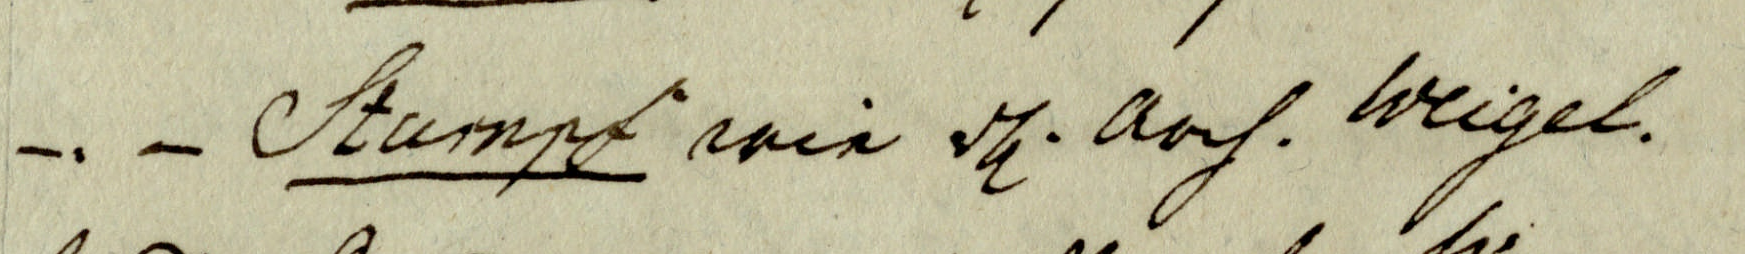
Stumpf wie dh. Arch. Weigel.
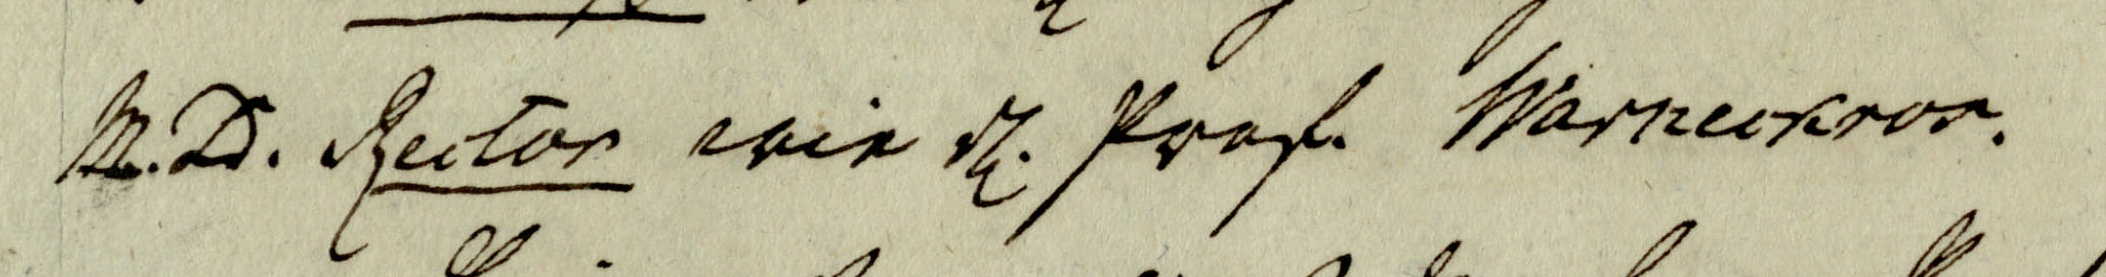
M. D. Rector wie dh. Prof. Warneckros.
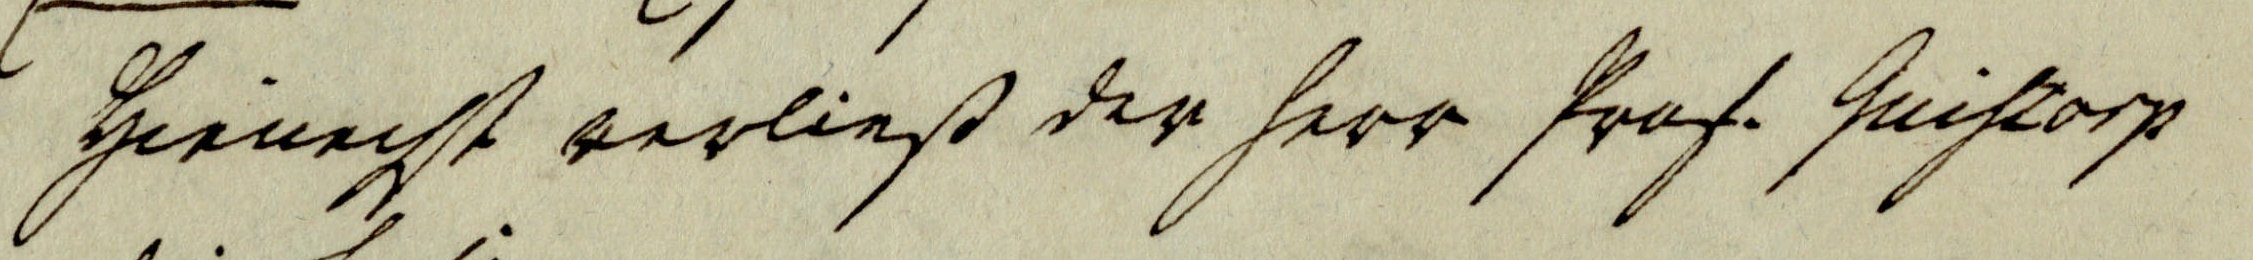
Hienechst verließ der Herr Prof. Quistorp
